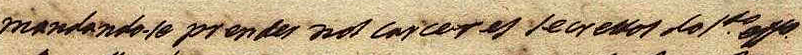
mandando-se prender nos carceres secrettos do s.to off.o
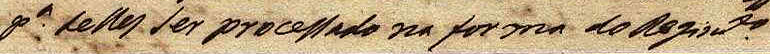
p.a delles ser processado na forma do Regim.to
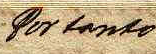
Pertanto.
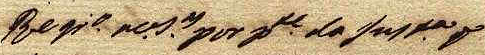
Reqr.o a v.s.as por p.te da Iust.a q̄
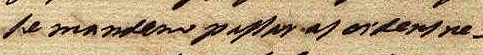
se mandem passar as ordens ne
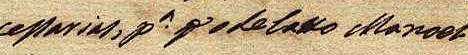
cessarias, p.a q̄ o delatto ManoeL
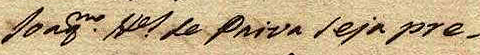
Ioaq.m H.es de Paiva seja pre
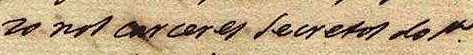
zo nos carceres secretos do s.to
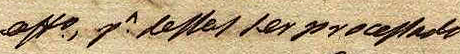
off.o, p.a delles ser processado
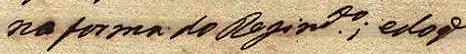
na forma do Regim.to; e do q̄
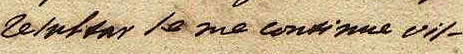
resultar se me continue vis
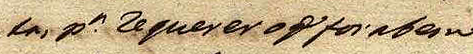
ta, p.a requerer o q̄ foi a bem
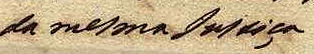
da mesma Iustiça
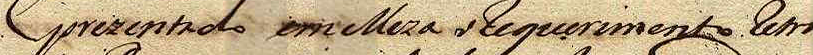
E prezentado em Meza o Requerimento Retro
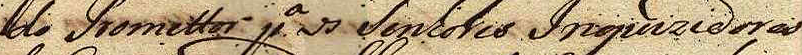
do Promettor p.a os Senhores Inquizidores
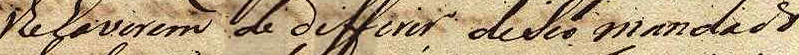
lhe haverem de differir de Seo mandado
